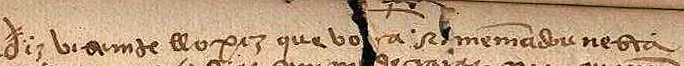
diz visemte llopez que vosa .s. me mādou nesta
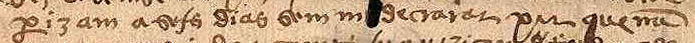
ꝑizam a seJs dias sem me decrarar por que erā
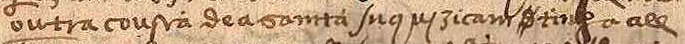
outra coussa de a samta Jnqujziçam dtinha all
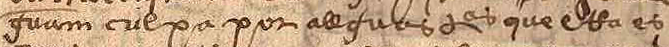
guam culpa por allguas tas que eRa es
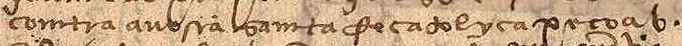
comtra a nossa samta fe catolyca peço a v.
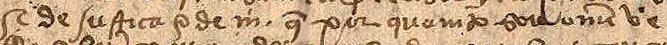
s. de Justiça e de m. q̄ porquamto sou omē ve
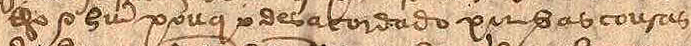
lho e hū pouqo desacordado por ꞩ as cousas
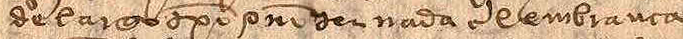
de largo tpō e nō ter nada ē lembrança
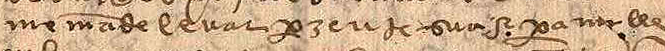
me māde leuar ꝑzente sua s. ꝑa me lle
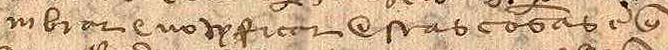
mbrar e notyficar essas cosas ē q̄
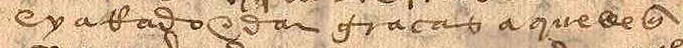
ey aRado e dar graças aquelle q̄
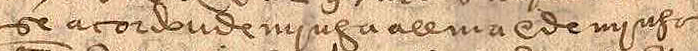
se acordou de mjnha allma e de mjnha
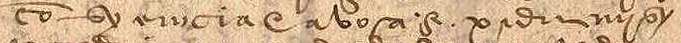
cōsyemcia e a vosa s. pidir mjsy
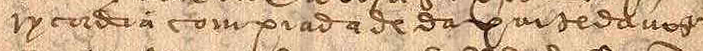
rycordia com piadade da parte da nosa
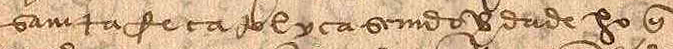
samta fe catolyca semdo ꝟdade ho q̄
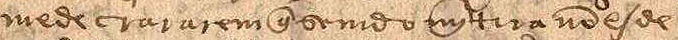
me decrararem q̄ semdo mītira n̄o eJde
